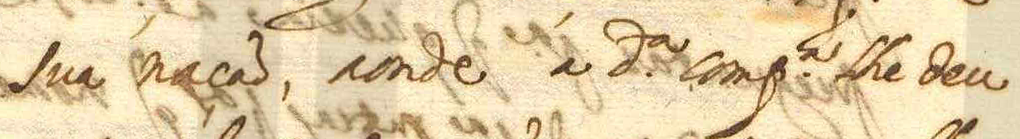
sua naçaõ, aonde a d̄.a comp.a lhe deu
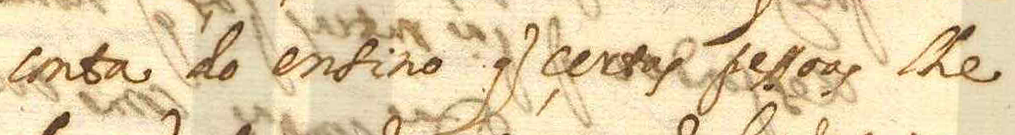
conta do ensino q̄ certas pessoas lhe
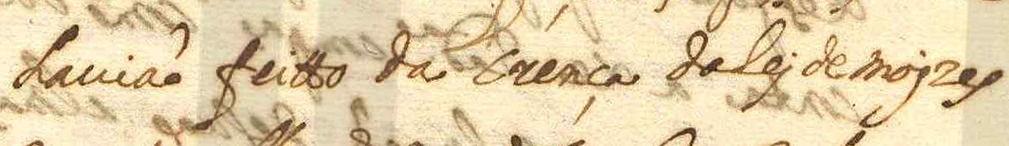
hauiaõ feitto da crença da lej de moyzes
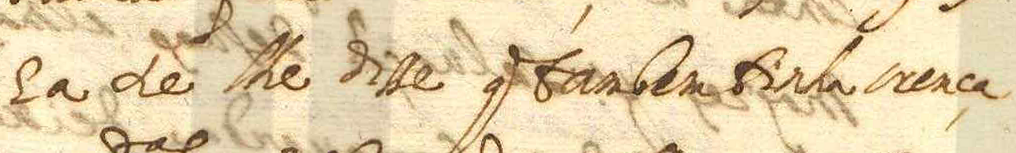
E a re lhe disse q̄ tambem tinha crença
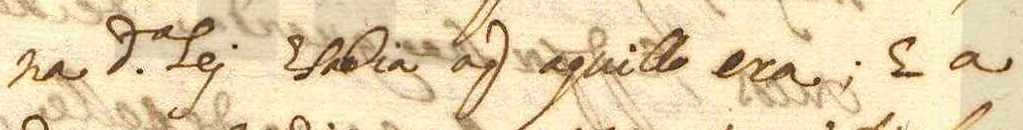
na d̄.a Lej E sabia o q̄ aquillo era; E a
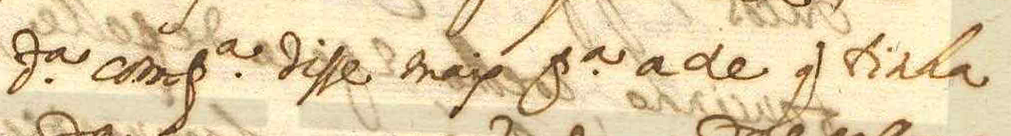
d̄.a compa. disse mais p.a a re q̄ tinha
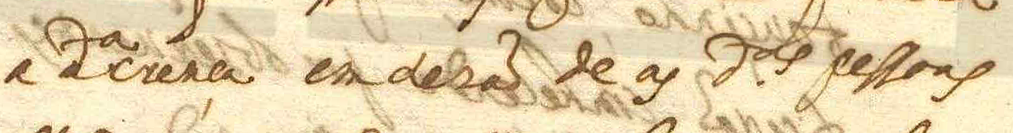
a d̄a crença em rezaõ de as d̄.as pessoas
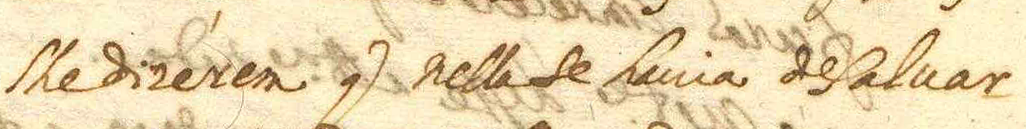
lhe dizerem q̄ nella se hauia de saluar
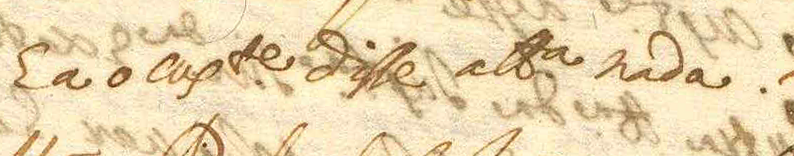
E ao custe. disse a tta nada.
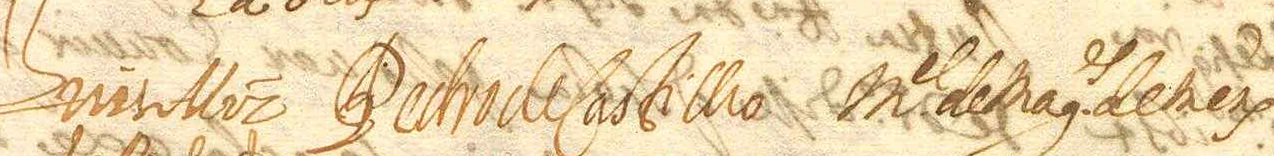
Luis Aluz̄ Pedro de Castilho Mel. de Mag.es de men̄s.
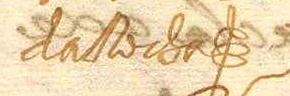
da Rocha
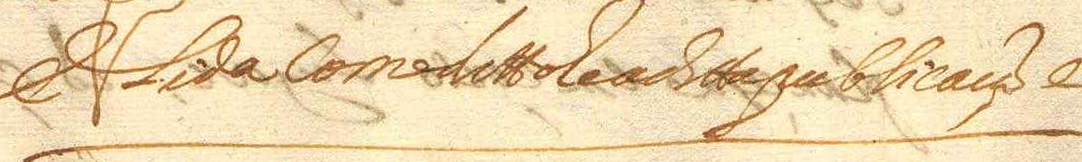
E lida como ditto he a ditta publicaçaõ e
